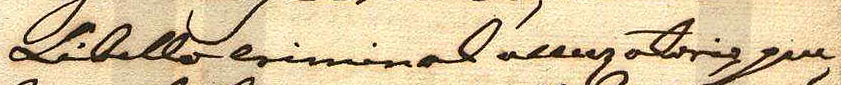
Libello criminal accuzatorio, que
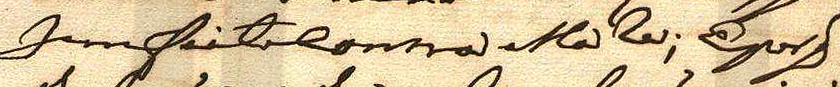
tem feito contra ella Re; E porq̄
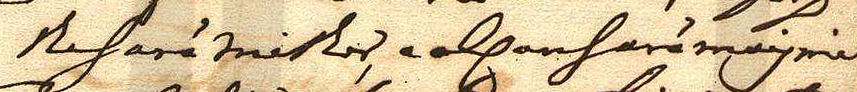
lhe fará milhor, e alCansará mais mi
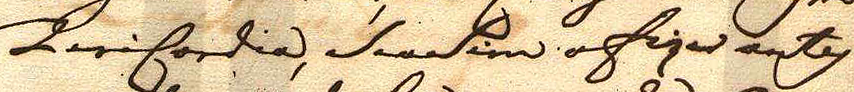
ZeriCordia, Se aSim o fizer antes
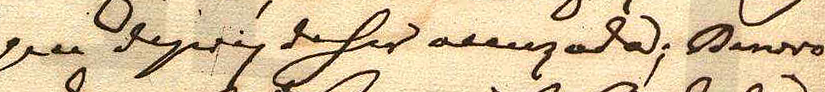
que depois de ser accuzada; De novo
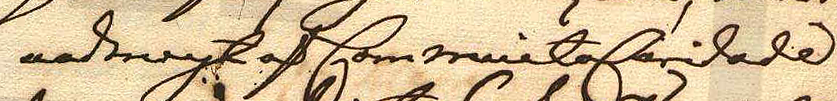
a admoestaõ Com muita Caridade
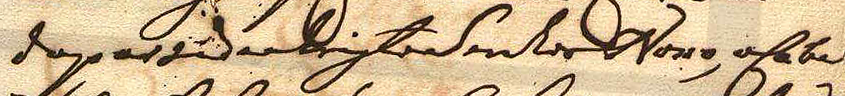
do parte de christo Senhor Nosso, aCabe
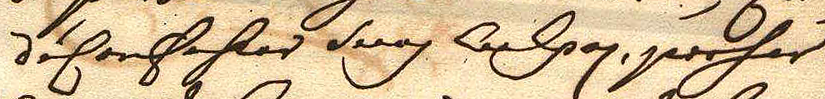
de Confessar suas Culpas, por ser
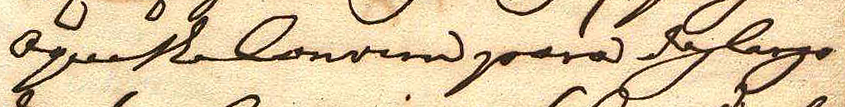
o que lhe Convem para descargo
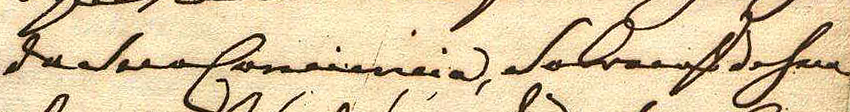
da Sua Comciençia, Salvaçaõ da sua
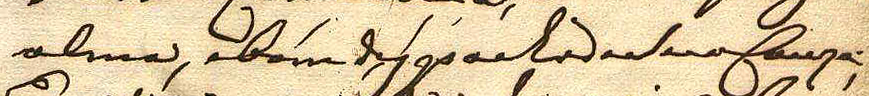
alma, e bóm despacho da Sua Cauza;
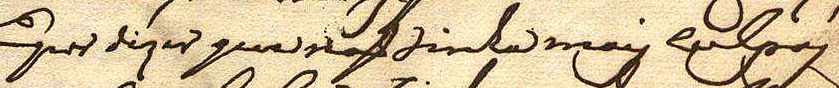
E por dizer que naõ tinha mais culpas
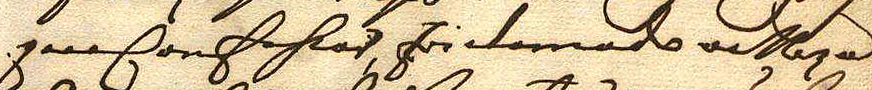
que Confessar, foi chamado a Meza
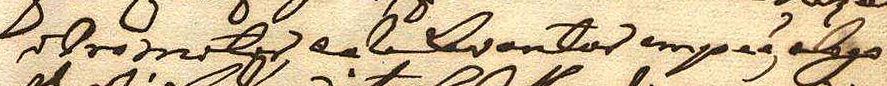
o Promotor, e a Re Levantar em peé, e logo
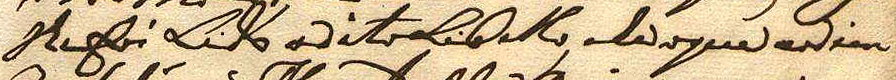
lhe foi Lido o dito Libello, e he o que ao dian
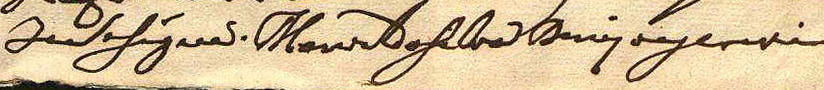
te Se ségue. Manoel da silva Denis o escrevi
